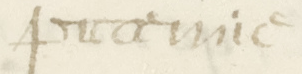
præmie
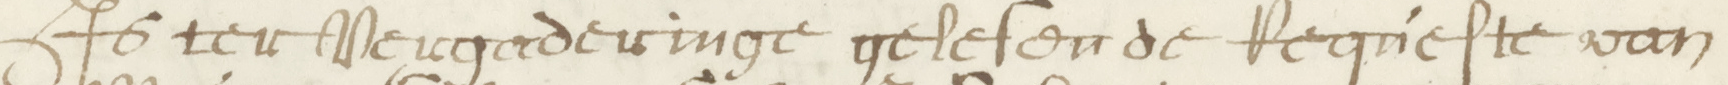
Is ter Vergaderinge gelesen de Requeste van
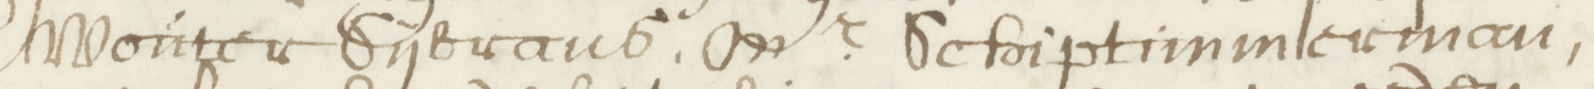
Wouter Sijbrans, mr. Schiptimmerman,
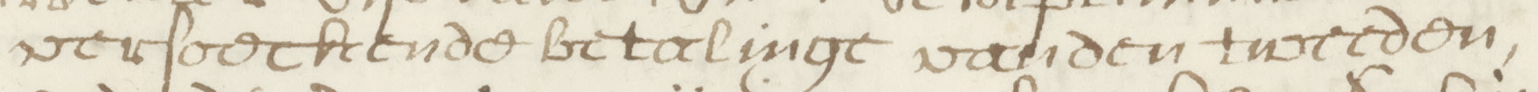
versoeckende betalinge vanden tweeden,
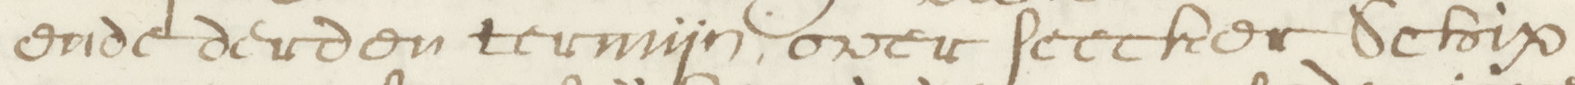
ende derden termijn, over seecker Schip
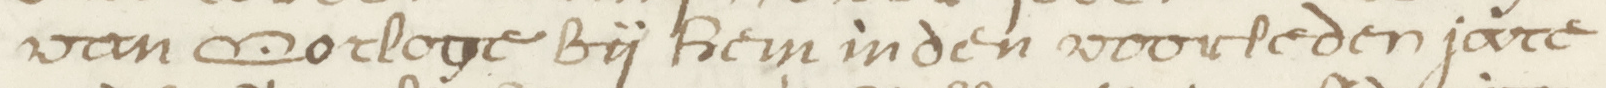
van Oorloge bij hem inden voorleden jare
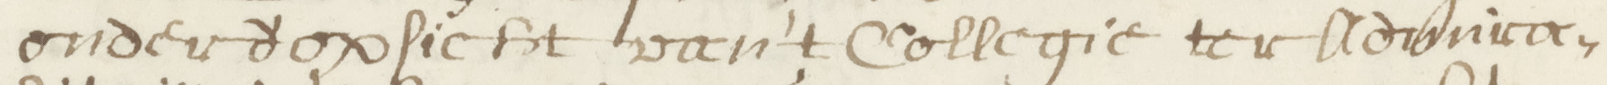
onder d'opsicht van't Collegie ter Admira,,
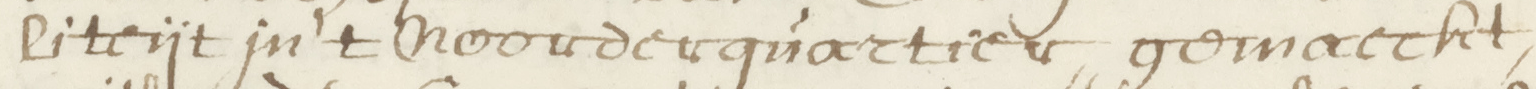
liteijt in 't noorderquartier gemaeckt,
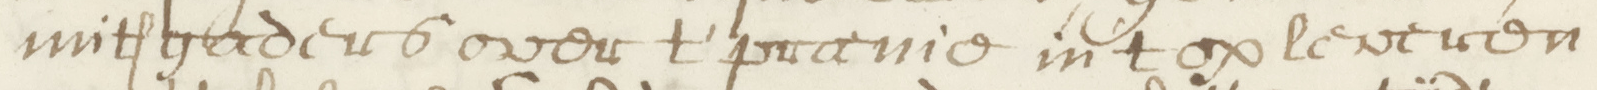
mitsgaders over t'præmie in't opleveren
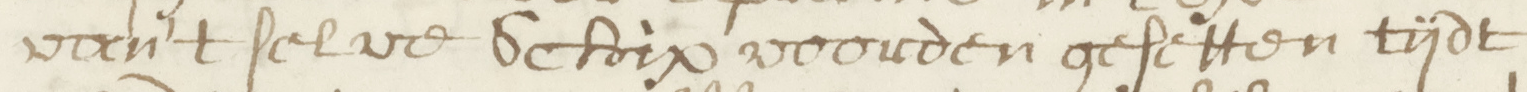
van't selve Schip voorden gesetten tijdt,
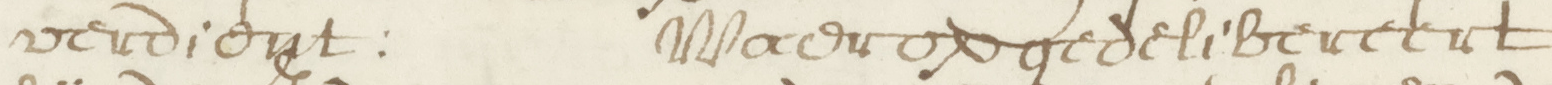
verdient: Waerop gedelibereert
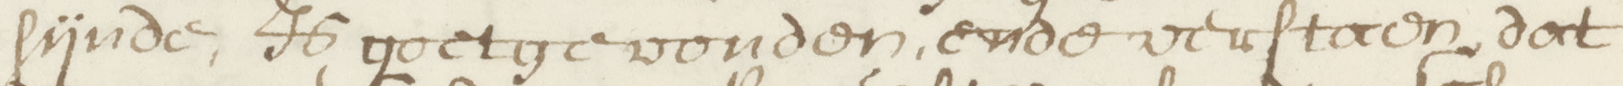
sijnde, Is goetgevonden, ende verstaen, dat
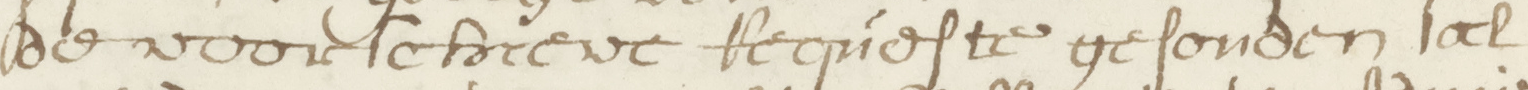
de voorschreve Requeste gesonden sal
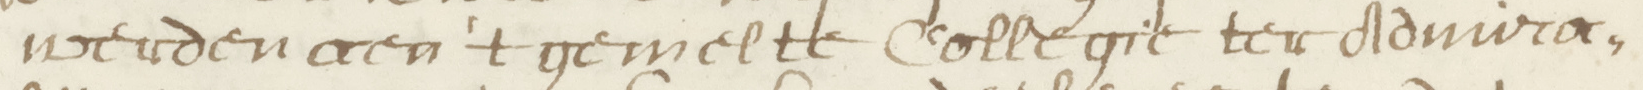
werden aen't gemelte Collegie ter Admira,,
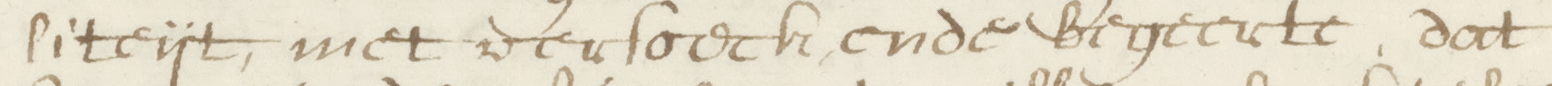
liteijt, met versoeck, ende begeerte, dat
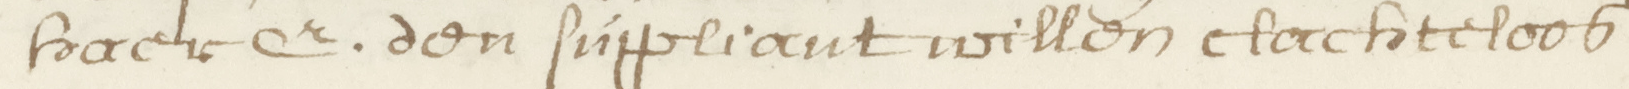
haer E. den suppliant willen clachteloos
